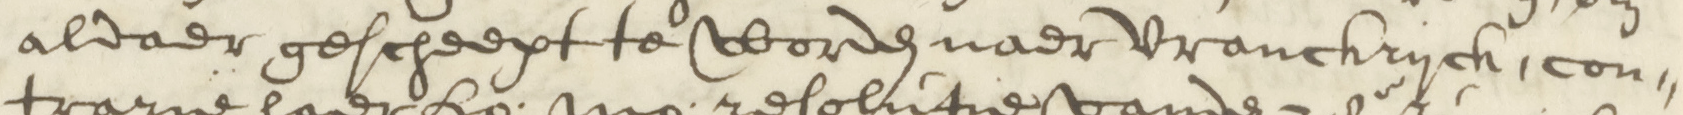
aldaer gescheept te worden naer Vranckrijck, con„
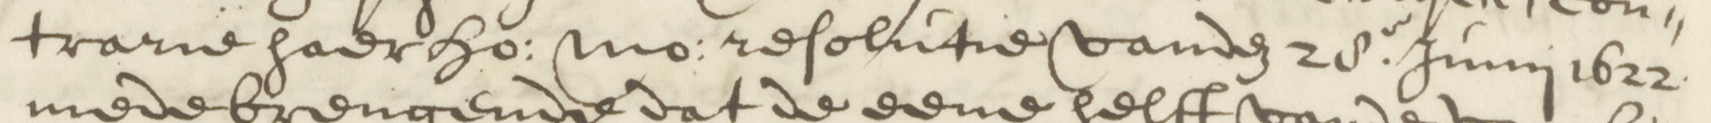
trarie haer Ho:Mo: resolutie vanden 28e Junij 1622
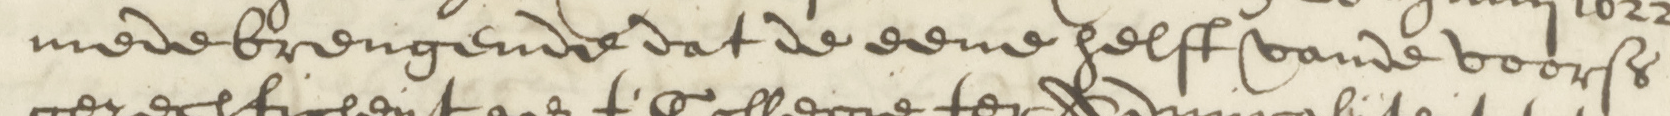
medebrengende dat de eene helft vande voorss.
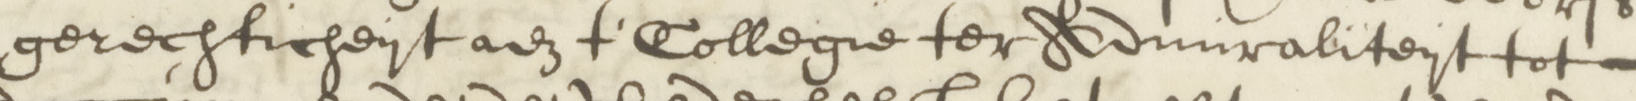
gerechticheijt aen t‛Collegie ter Admiraliteijt tot —
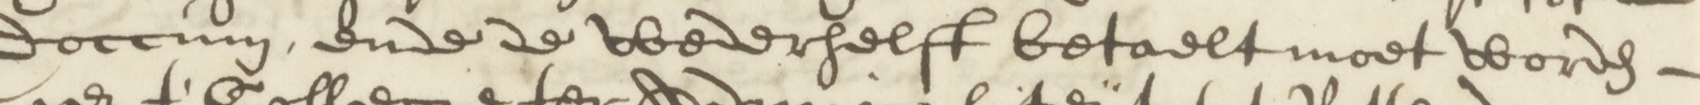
Doccum, ende de wederhelft betaelt moet worden —
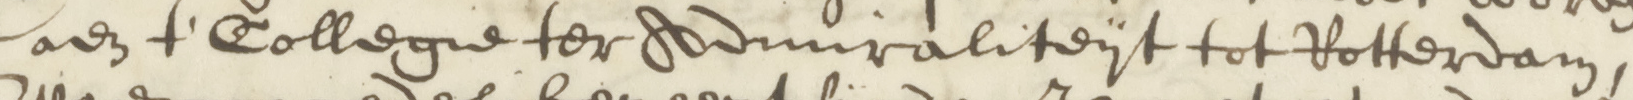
aen t‛Collegie er Admiraliteijt tot Rotterdam,
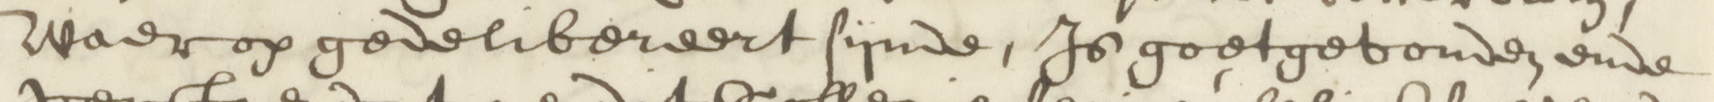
Waerop gedelibereert sijnde, Is goetgevonden ende
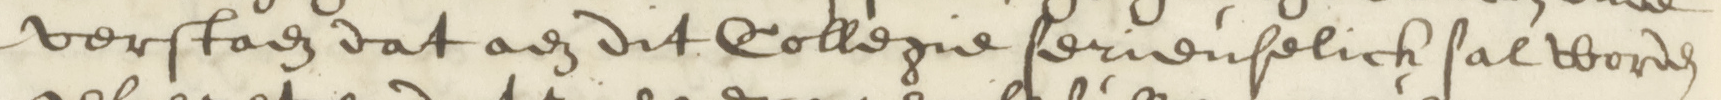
verstaen dat aen dit Collegie serieuselick sal worden
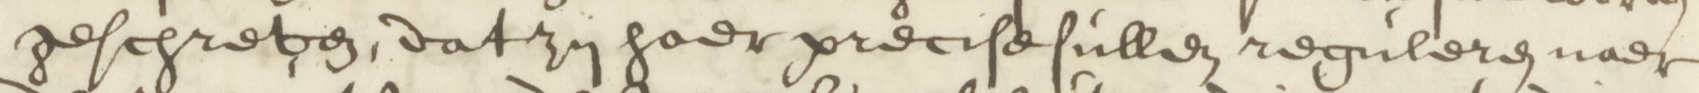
geschreven, dat zij haer precise sullen reguleren naer
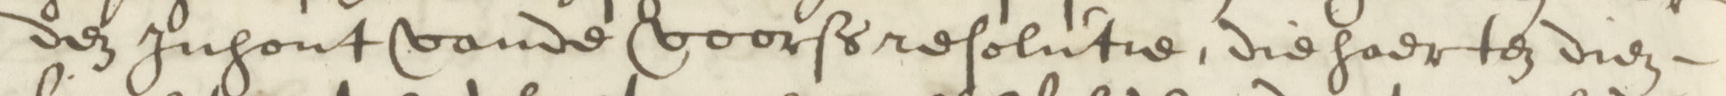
den Inhout vande voorss. resolutie, die haer ten dien —
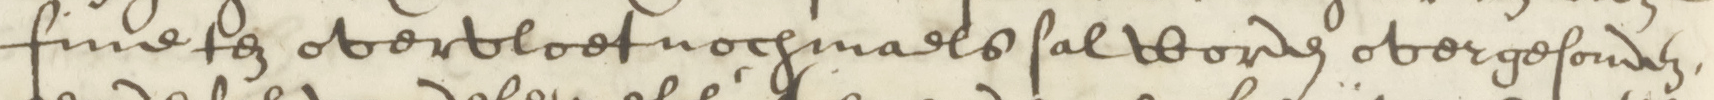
fine ten overvloet nochmaels sal worden overgesonden,
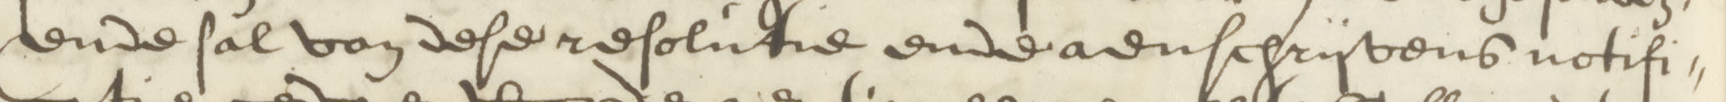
ende sal van dese resolutie ende aenschrijvens notifi„
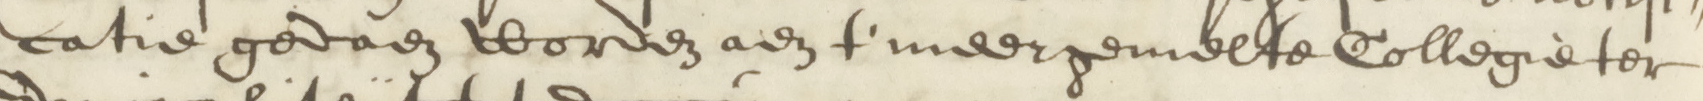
catie gedaen worden aen t‛meergemelte Collegie ter
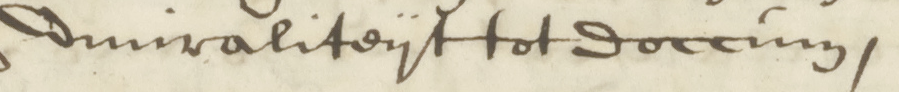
Admiraliteijt tot Doccum.
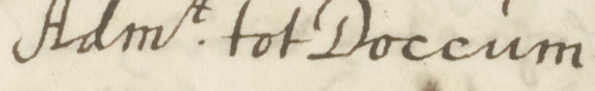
Admt. tot Doccum
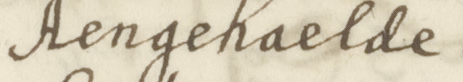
Aengehaelde —
